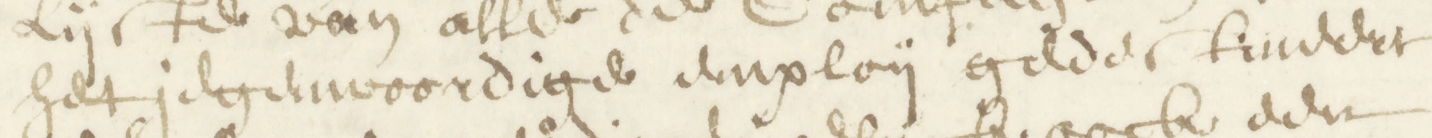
het jegenwoordige emploij gedestineert
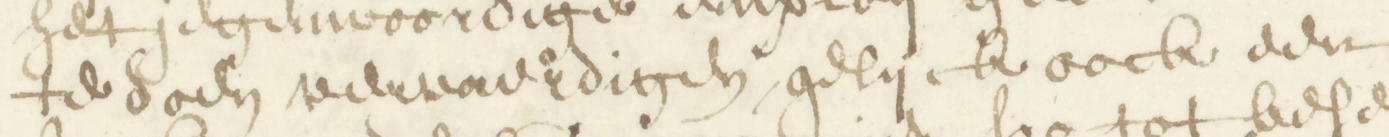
te doen vervaerdigen, gelijck oock een
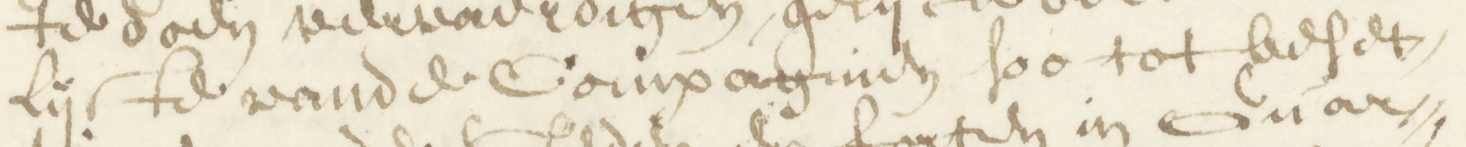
Lijste vande Compagnien soo tot beset„
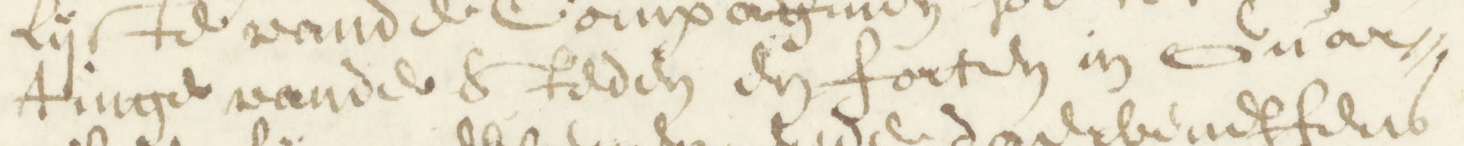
tinge vande Steden en forten in Guar„
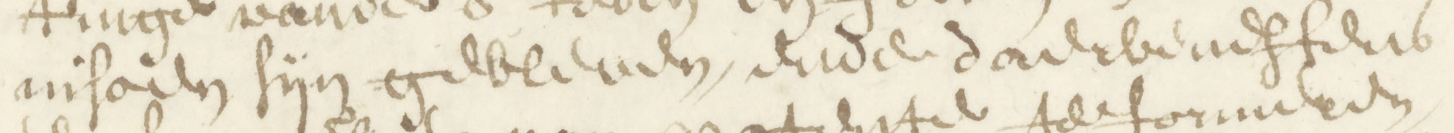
nisoen sijn gebleven, ende daerbeneffens
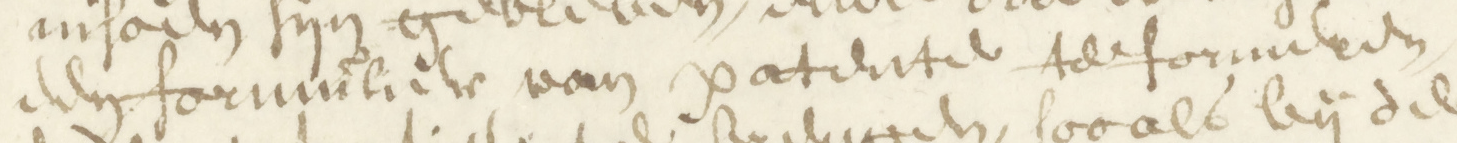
een formulier van patente te formeren
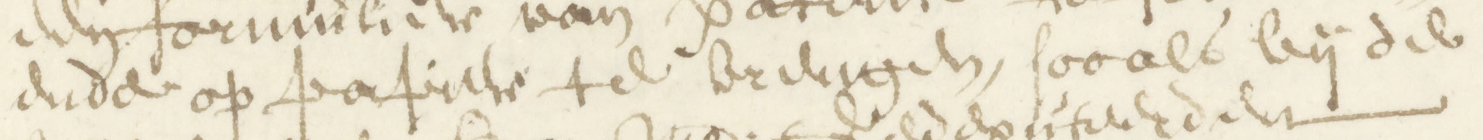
ende op papier te brengen, soo als bij de
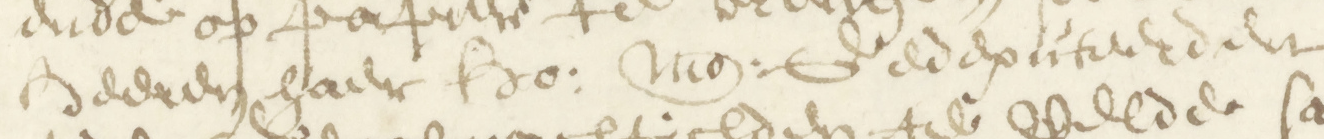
heeren haer Ho:Mo: Gedeputeerden
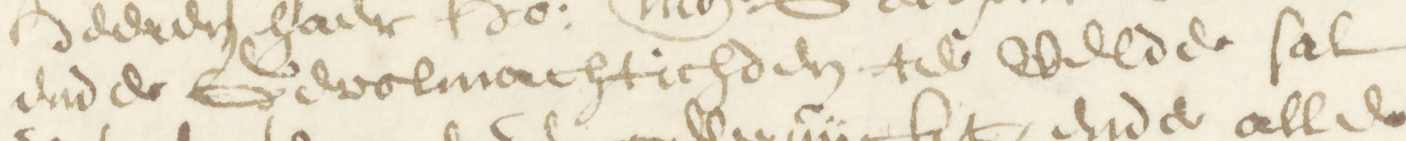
ende Gevolmachtichden te Velde sal
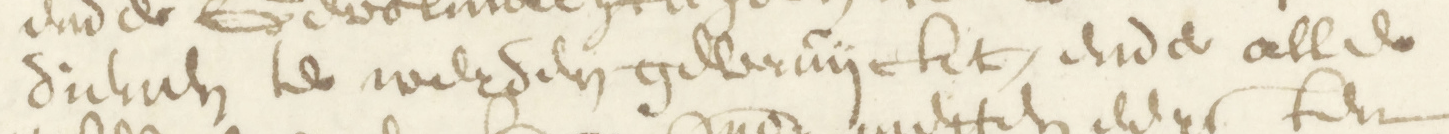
dienen te werden gebruijckt, ende alle
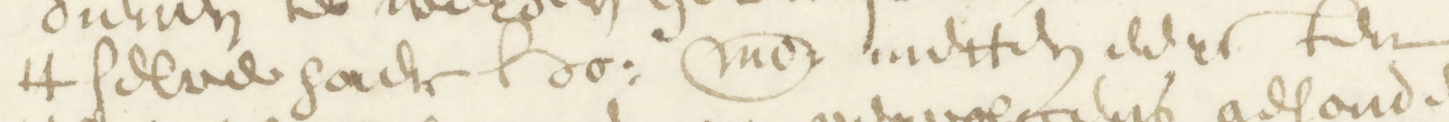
't selve haer Ho:Mo: metten eersten
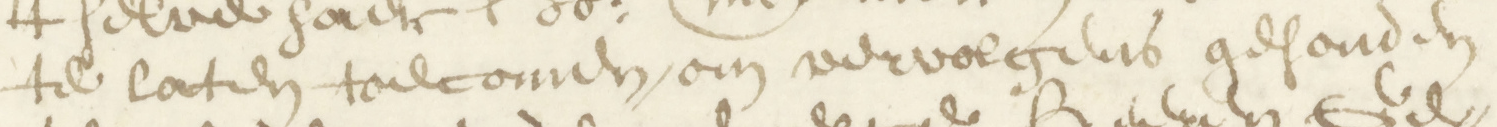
te laten toecomen, om vervolgens gesonden
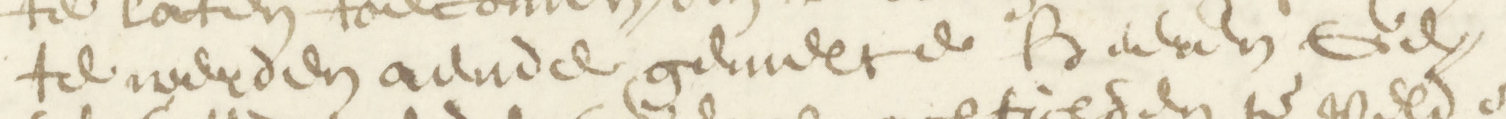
te werden aende gemelte Heeren Ge,,
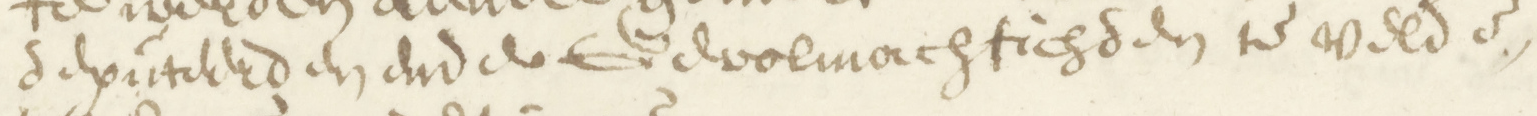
deputeerden ende Gevolmachtichden te Velde,
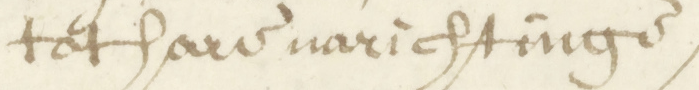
tot hare narichtinge.
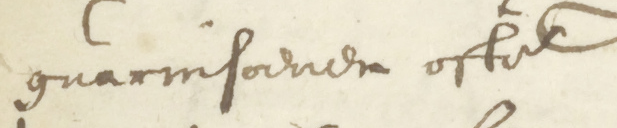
guarnisoenen ofte
